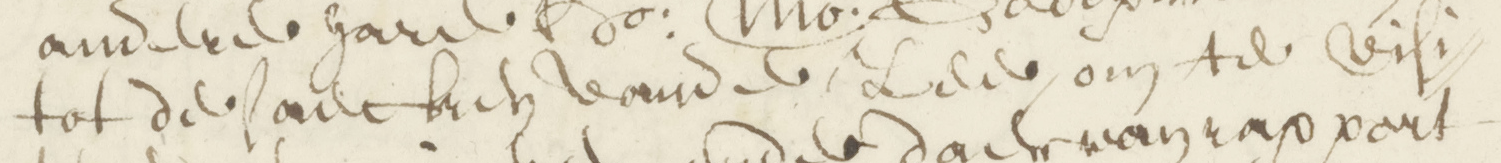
tot de saecken vande Zee, om te visi„
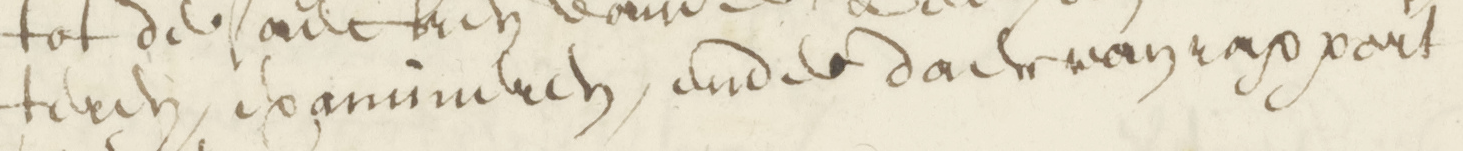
teren, examineren, ende daervan rapport
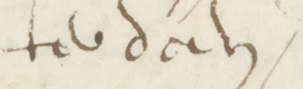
te doen.
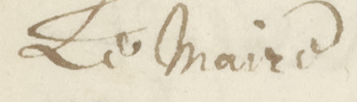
Le Maire
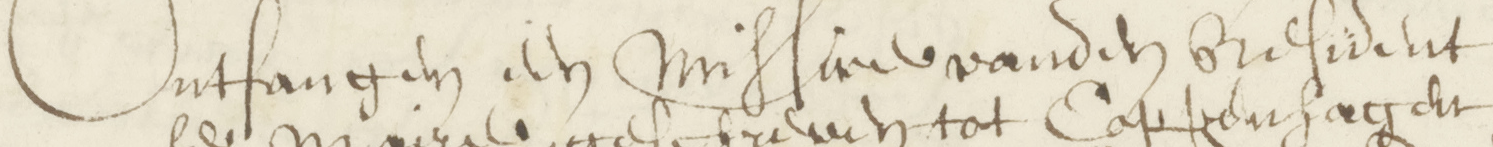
Ontfangen een Missive vanden Resident
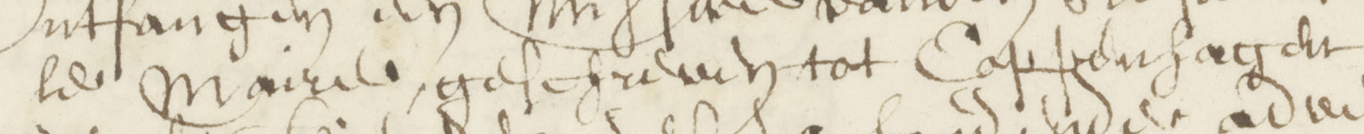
le Maire, geschreven tot Coppenhagen
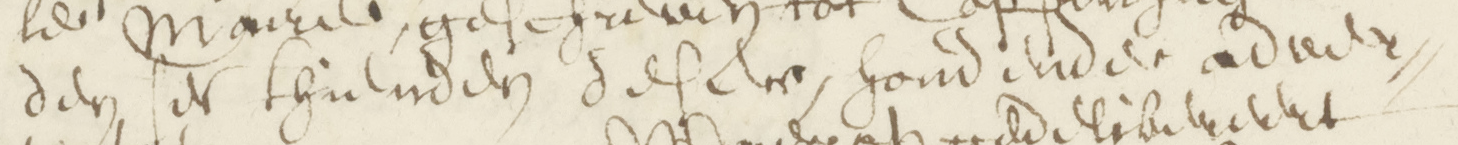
den sesthienden deser, houdende adver„
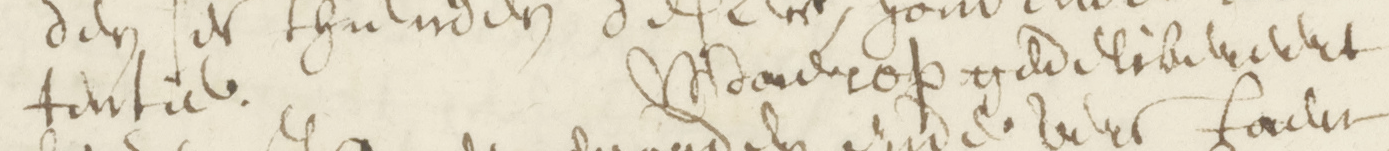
tenie. Waerop gedelibereert
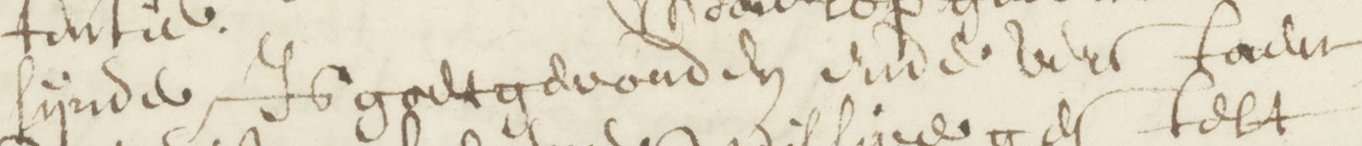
sijnde, Is goetgevonden ende verstaen
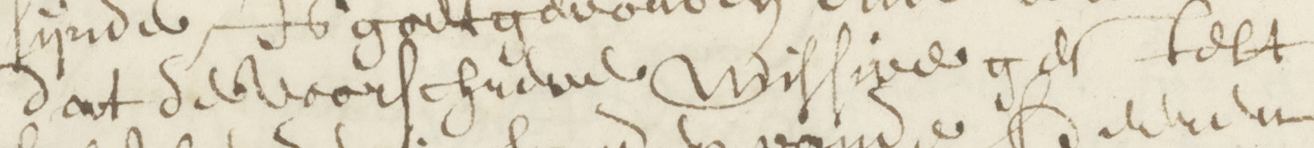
dat de voorschreve Missive gestelt
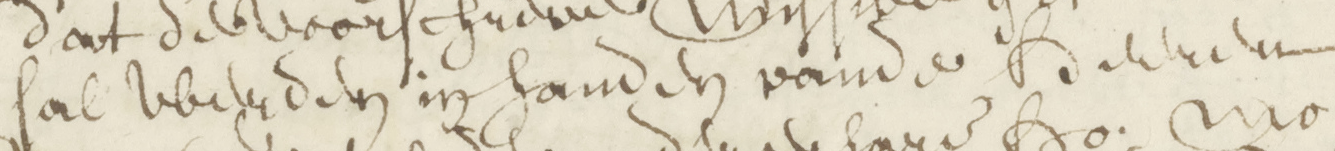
sal werden in handen vande Heeren
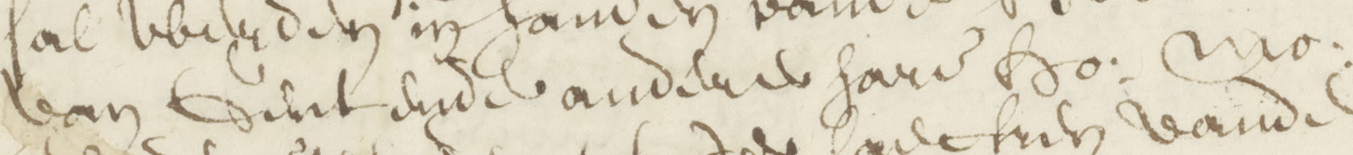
van Gent ende andere hare Ho:Mo:
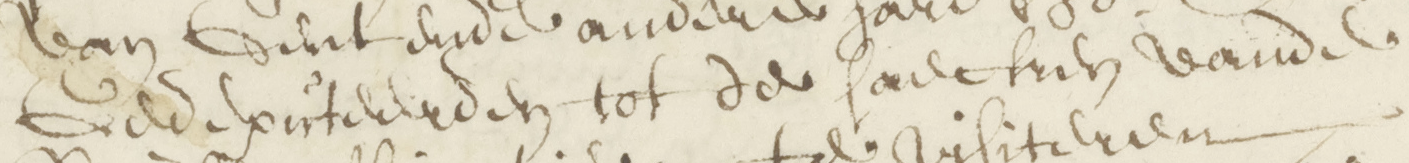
Gedeputeerden tot de saecken vande
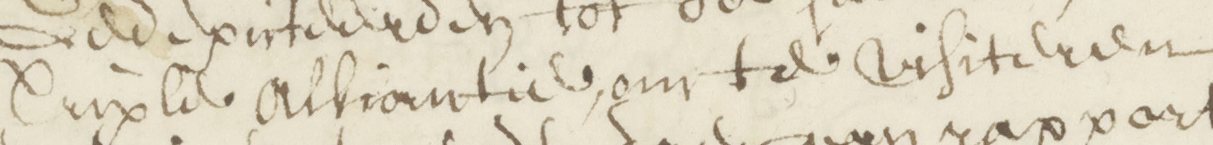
Triple Alliantie, om te visiteren,
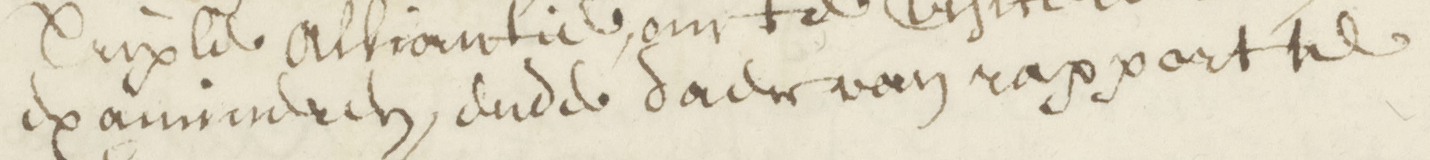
examineren, ende daervan rapport te
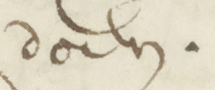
doen.
